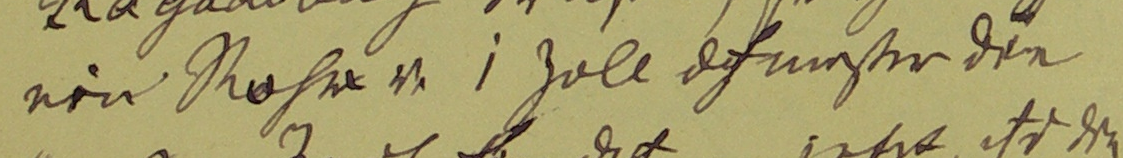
ein Rohr von 1 Zoll Durchmßer die
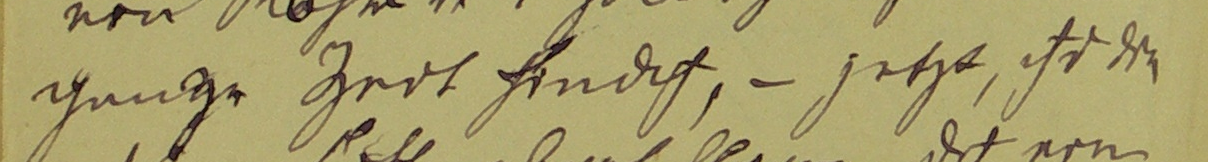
ganze Zeit hindurch, - jetzt ist die
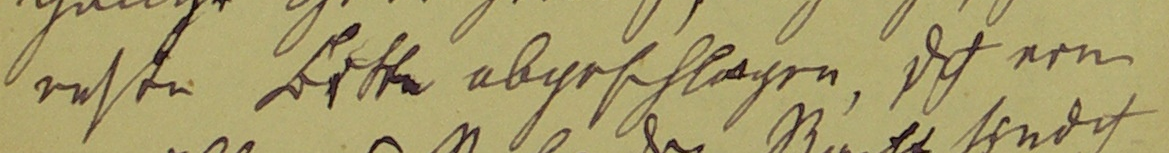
erste Bitte abgeschlagen, damit ein
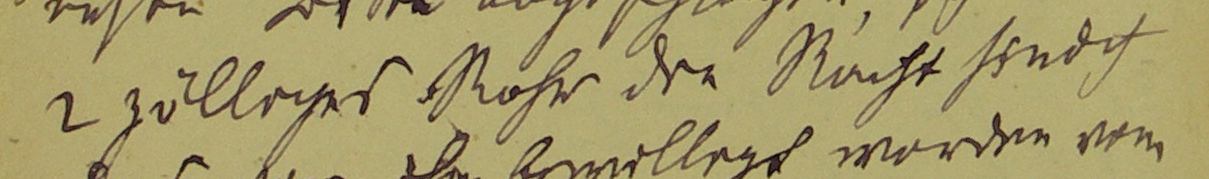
2 zölliges Rohr die Nacht hindurch
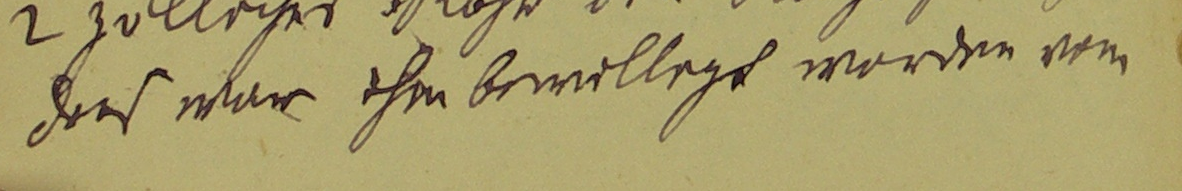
das war im bewilligt worden vom…
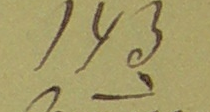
143
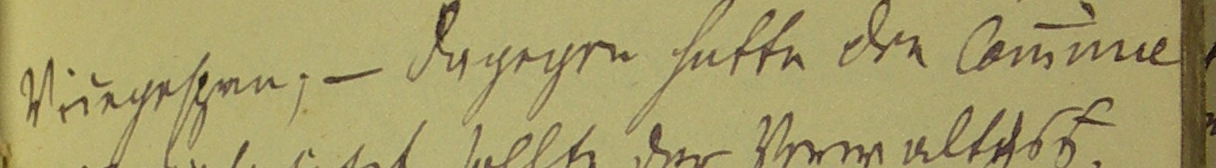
Vizegespann;-dagegen hatte die Commune
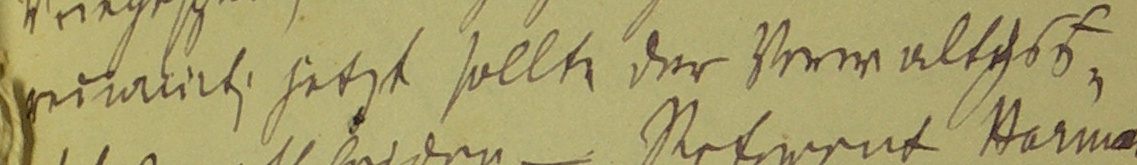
protestiert, -jetzt sollte der Verwaltungsaus¬
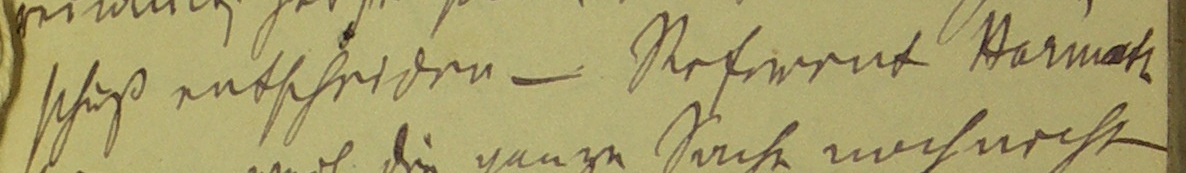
schuss entscheiden--?Stifert ?Narmak
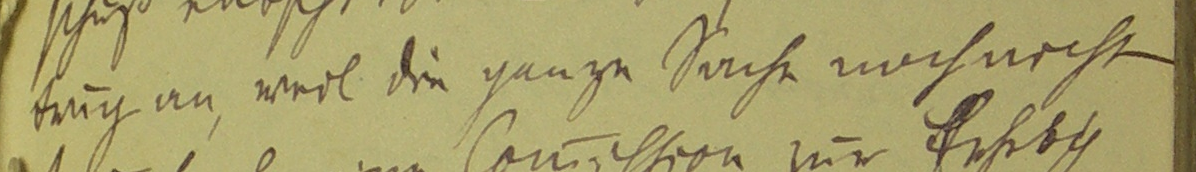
trug an , weil die ganze Sache noch nicht
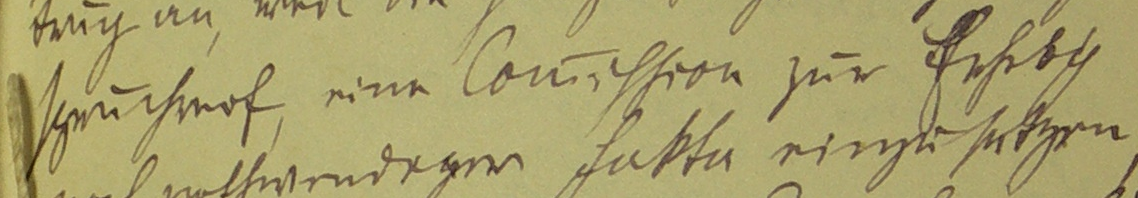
spruchreif , eine Commistron zur Erhebung
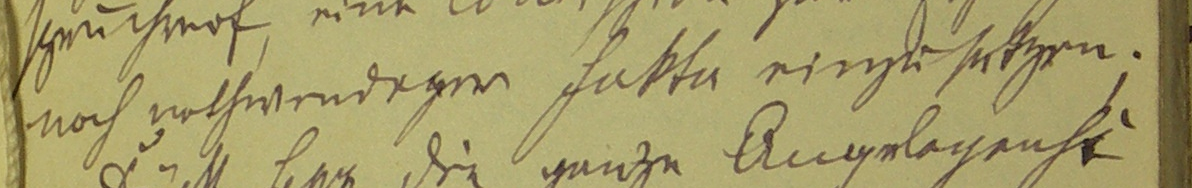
noch notwendigen Fakten einzusetzen.
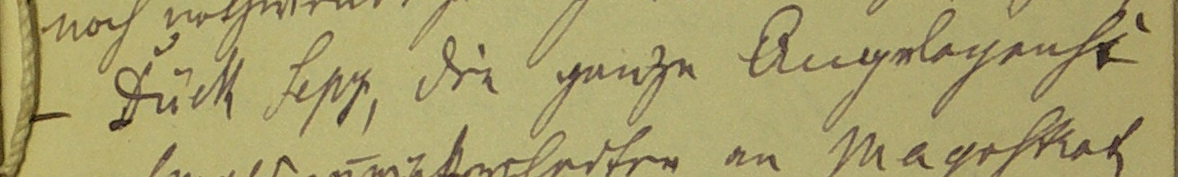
Dück Sepp, die ganze Angelegenheit
